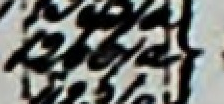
1266/a
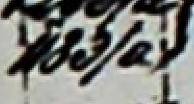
1183/a
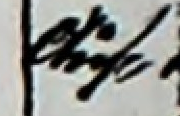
Aus„
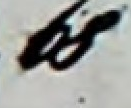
68
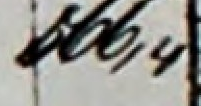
566,4
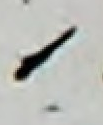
1
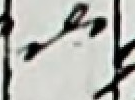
do
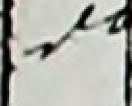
do
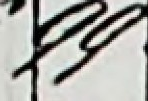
99
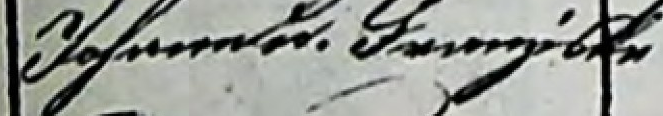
Johann u. Franziska
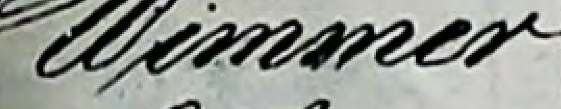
Wimmer
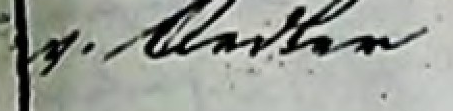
v. Oedler
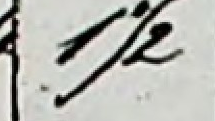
1½
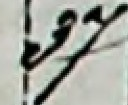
37
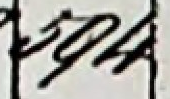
594
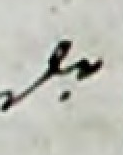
do
